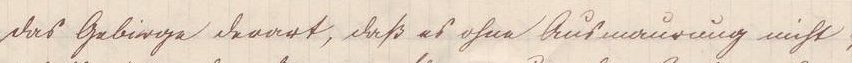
das Gebirge derart, daß es ohne Ausmaurung nicht
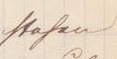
stehen
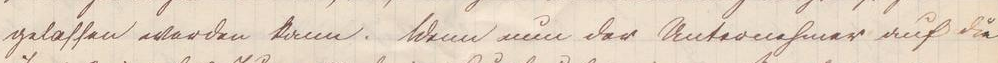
gelassen werden kann. Wenn nun der Unternehmer auf die
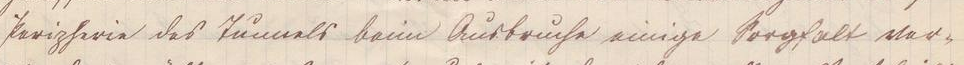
Peripherie des Tunnels beim Ausbruche einige Sorgfalt ver-
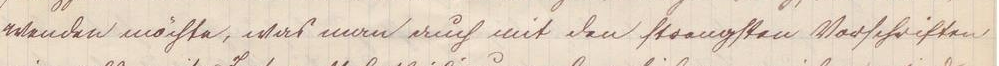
wenden möchte, was man auch mit den strengsten Vorschriften
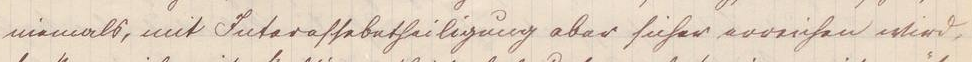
niemals, mit Interessebetheiligung aber sicher erreichen wird,
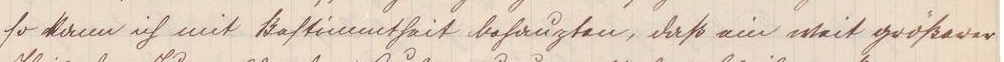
so kann ich mit Bestimmtheit behaupten, daß ein weit größerer
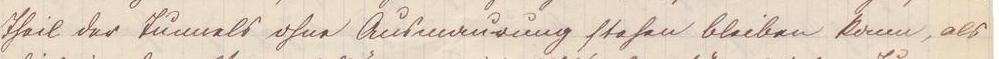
Theil der Tunnels ohne Ausmaurung stehen bleiben kann, als
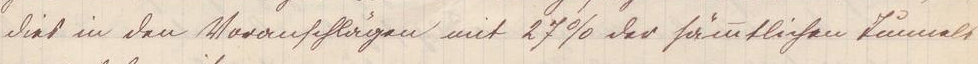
dies in den Voranschlägen mit 27% der sämmtlichen Tunnels
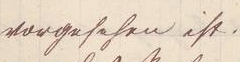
vorgesehen ist.
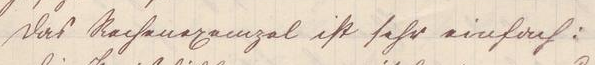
Das Rechenexempel ist sehr einfach:
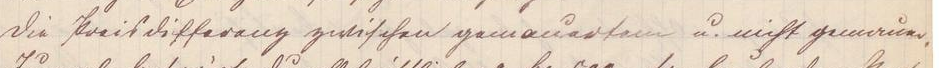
Die Preisdifferenz zwischen gemauertem u. nicht gemauer-
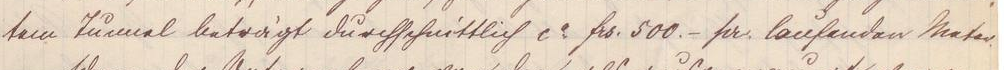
tem Tunnel beträgt durchschnittlich ca frs. 500.– pr. laufenden Meter.
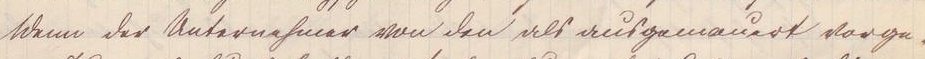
Wenn der Unternehmer von den als ausgemauert vorge-
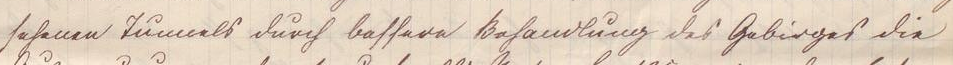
sehenen Tunnels durch bessere Behandlung des Gebirges die
